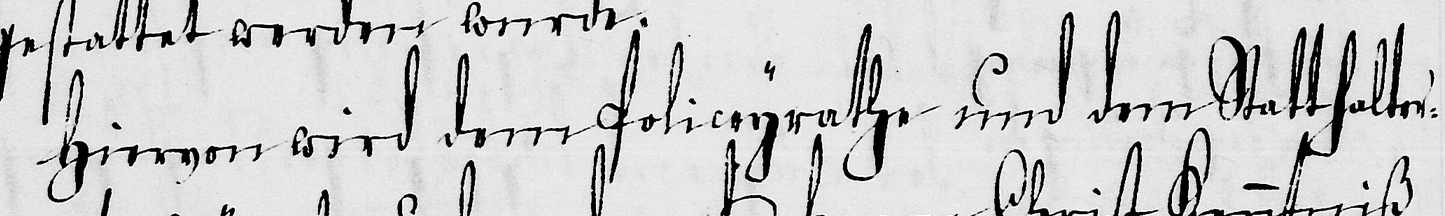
Hiervon wird dem Policeyrathe und dem Statthal¬
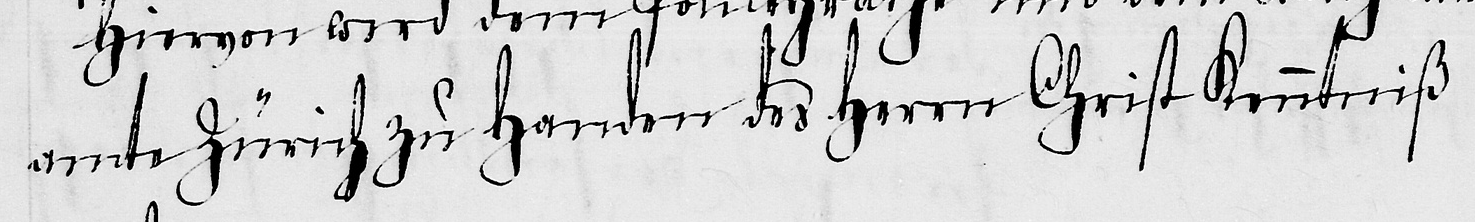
amte Zürich zu Handen des Herrn Christ Kenntniß
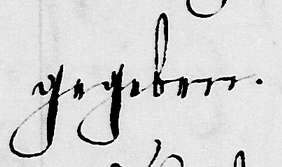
gegeben.
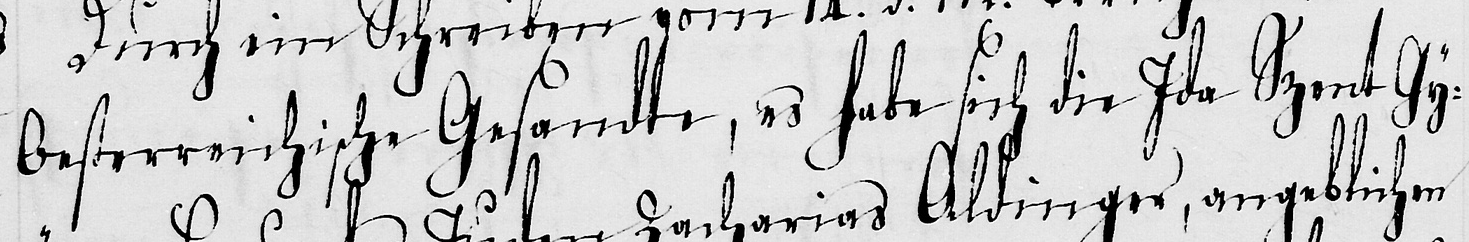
Oesterreichische Gesandte, es habe sich die Ida Szent Gy¬
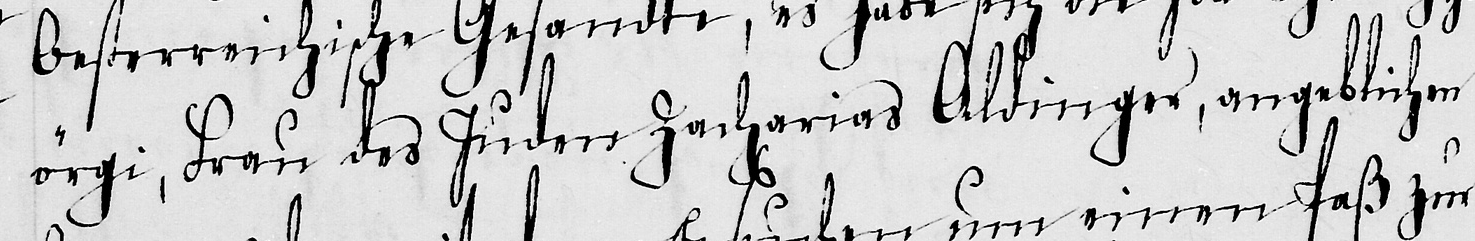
örgi, Frau des Juden Zacharias Aldinger, angeblichen
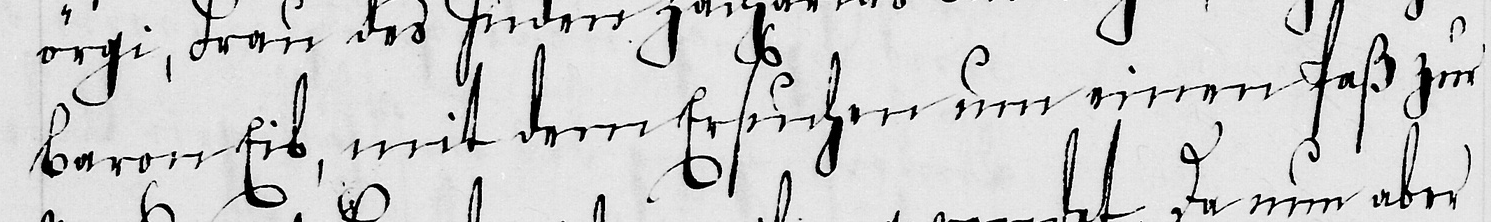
Baron Eib, mit dem Ersuchen um einen Paß zur
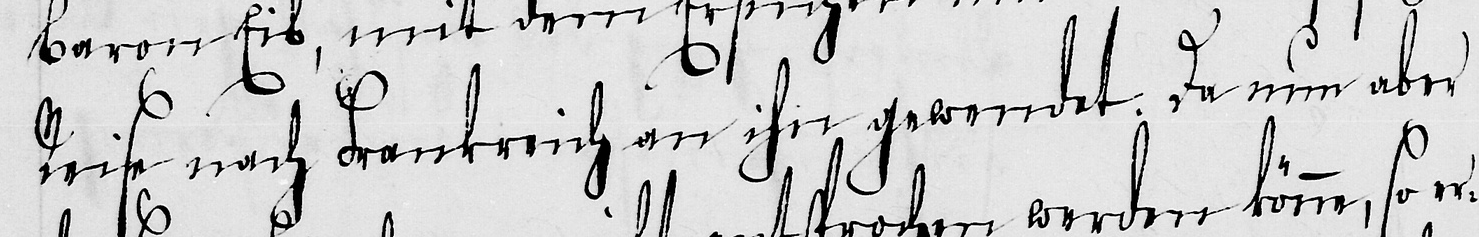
Reise nach Frankreich an ihn gewendet. Da nun aber
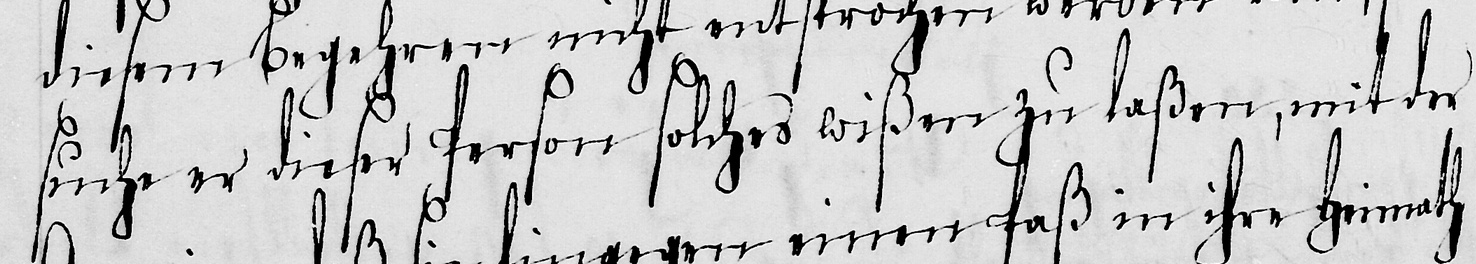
suche er dieser Person solches wißen zu laßen, mit der
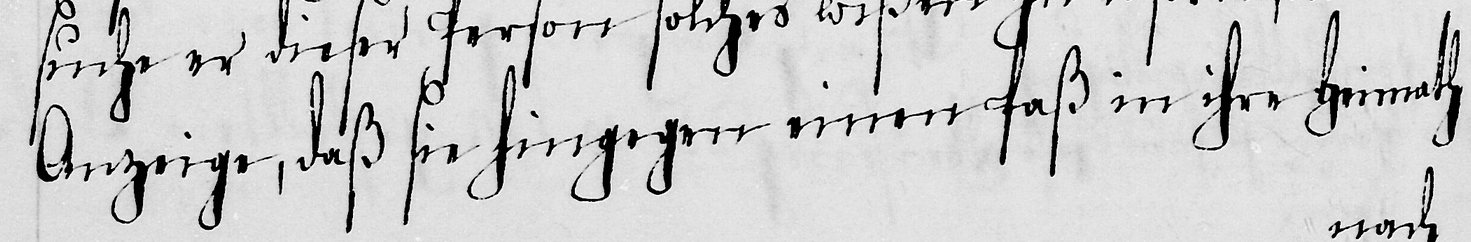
Anzeige, daß sie hingegen einen Paß in ihre Heimath
